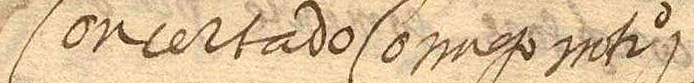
Concertado Comigo notro
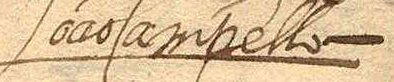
João Campello
